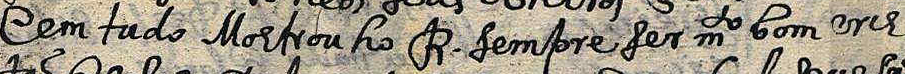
e em tudo Mostrou ho R. sempre ser mto bom cris
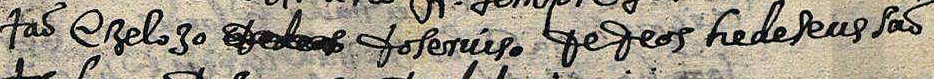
taõ e zelozo Dedeos Do seruiso De Deos he de seus saõ
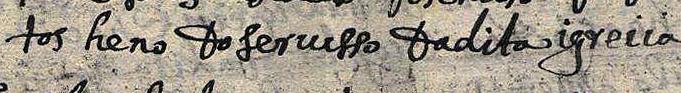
tos he no Do seruisso Da dita igreiia
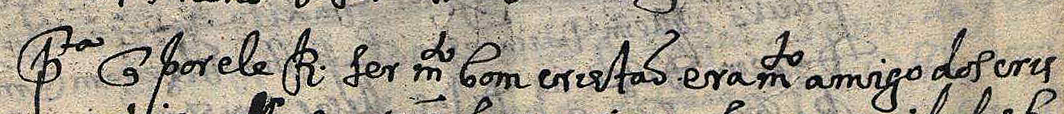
pra q̄ por elle R. ser mto bom cristaõ era mto amigo dos cris
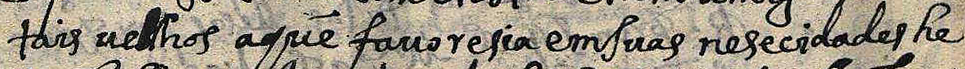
tais uelhos a quē fauoresia em suas nesecidades he
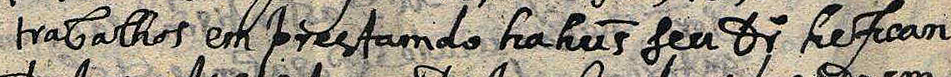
trabalhos emprestamdo ha hūs seu Dro he fican
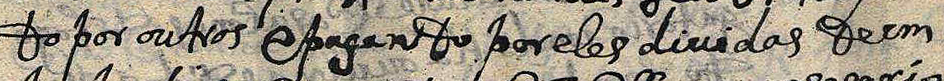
Do por outros e paganDo por eles diuidas De em
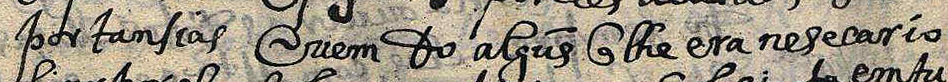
portansias E uemDo algūs q̄ lhe era nesecario
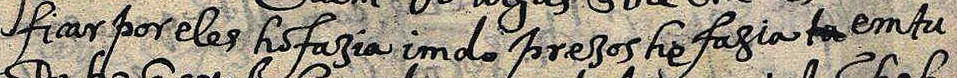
ficar por eles ho fazia imdo prezos he fazia ta em tu
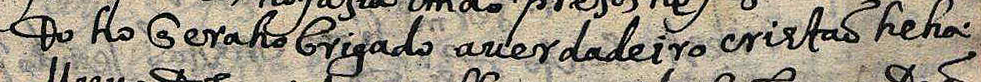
Do ho q̄ era hobrigado a uerdadeiro cristaõ he ha
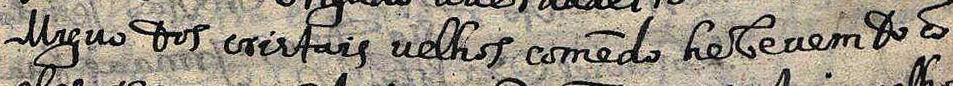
Miguo Dos cristais uelhos comēdo he beuemdo cō
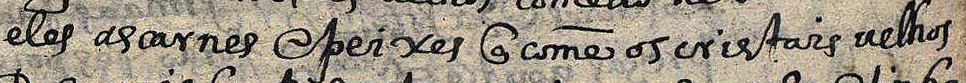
eles as carnes e peixes q̄ comē os cristais uelhos
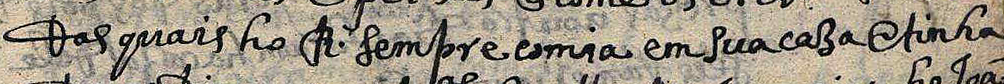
Das quais ho R. sempre comia em sua caza e tinha
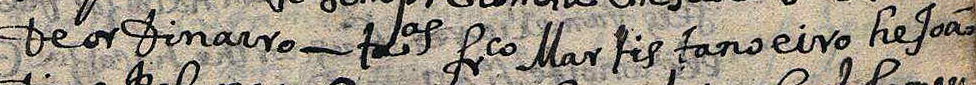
De orDinairo tas frco Martis tanoeiro he João
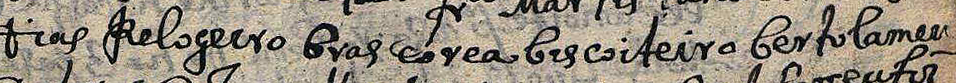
Dias Relogeiro bras corea biscoiteiro bertolameu
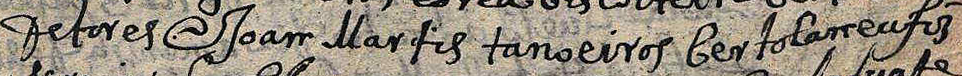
De tores e Joam Martis tanoeiros bertolameu frz̄
